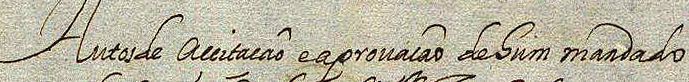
Autos de aceitaçaõ e aprouação de hum mandado
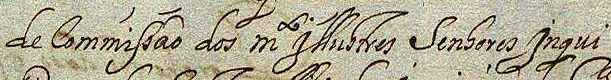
de Commissão dos mto Jllustres Senhores Jnqui
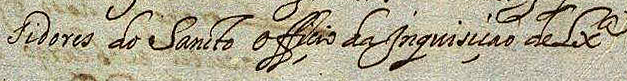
sidores do Sancto officio da Jnquisição de Lxa
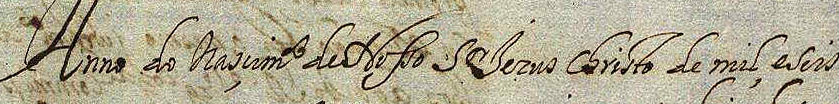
Anno do nascimto de Nosso Sor Iezus christo de mil e seis
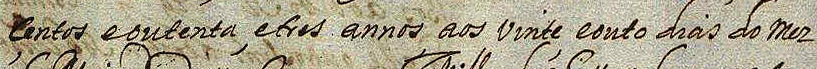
centos e outenta, e tres annos aos vinte, e outo dias do mez
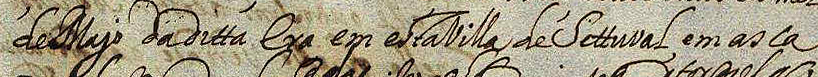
de Majo da ditta Era em esta Villa, de Setuval, em as ca
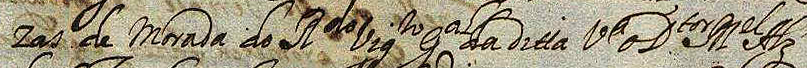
zas de morada do Rdo Vigro Gal da ditta V.a o Dtor Mel Alz̄
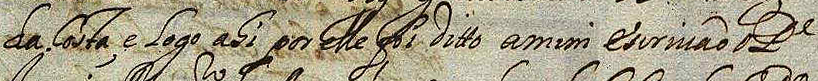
da Costa, e logo ahi por elle foi ditto a mim escriuaõ o Pe
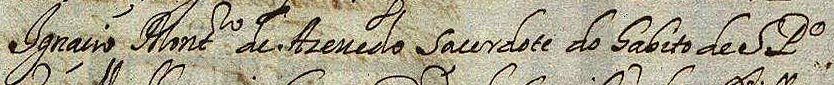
Ignacio Montro de Azeuedo Sacerdote do habito de S Po
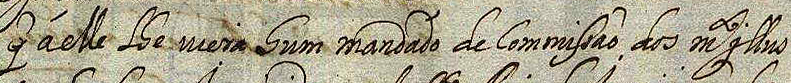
q̄ a elle lhe uiera hum mandado de Commissão dos mto jllus
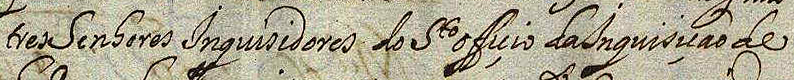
tres Senhores Inquisidores do Sto officio da Inquisiçaõ de
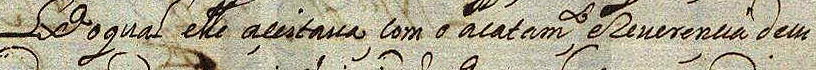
Lxa o qual elle aceitaua, com o acatamto, e Reuerencia deui
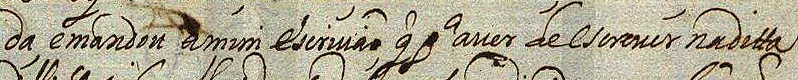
da, e mandou a mim escriuaõ, q̄ pa auer de escreuer na ditta
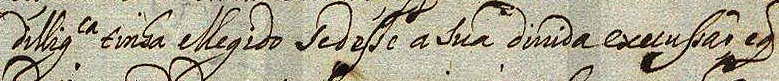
dilligca tinha ellegido se desse a sua diuida execussaõ, e q̄
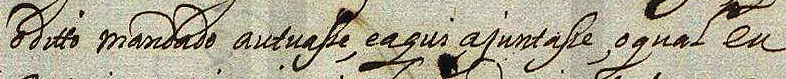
o ditto mandado autuasse, e aqui ajuntasse, o qual eu
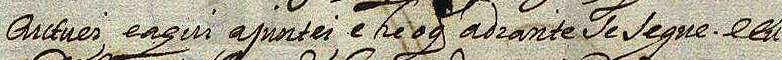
autuei, e aqui ajuntei, e he o q̄ adiante se segue. e eu
